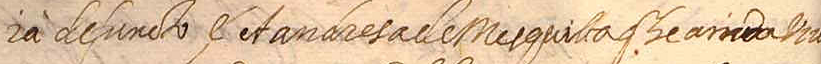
iá defuncto, E A andresa de Mesquitta q̄ he ainda Viu
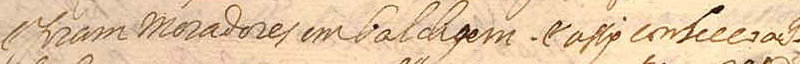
E foram moradores em baldigem. e assy conheceo a B
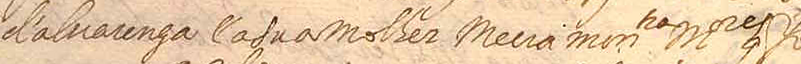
d'aluarenga E a sua molher Mecia montra Mores q̄ fo
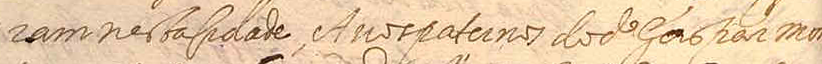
ram nesta Cidade, Auos paternos do do Gaspar mon
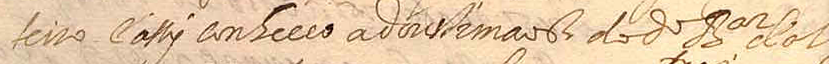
teiro E assy conheceo a dous Irmaõs do do Bar dal
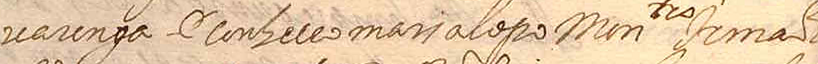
uarenga E conheceo maria lopo Montro Irmaā
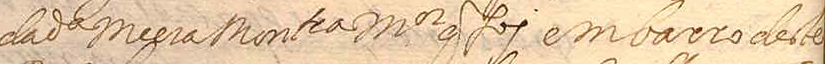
da da Mecia Montra Mor q̄ foj em barro deste
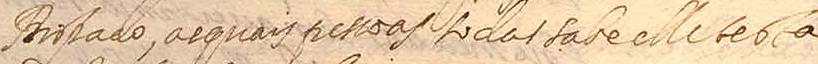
Bispado, as quais pessoas todas sabe elle testa
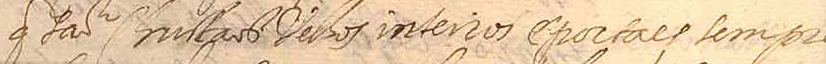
q̄ saõ Christaõs Velhos inteiros E por taes sempre
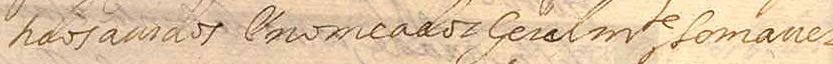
tidos auidos E nomeados Geralmte, sem auer
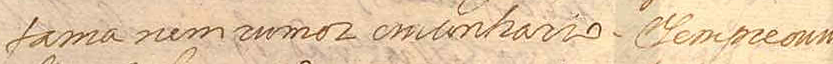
fama nem rumor em contrario, E sempre ouu
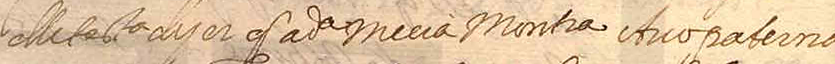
elle testa dizer q̄ a da mecia Montra Auo paterna
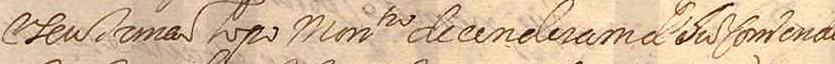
E seu Irmaõ Lopo Montro decenderam d'hū Com̄enda
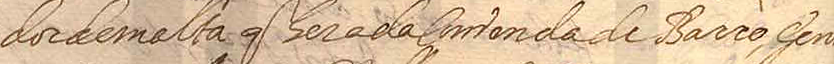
dor de malta q̄ hera da Com̄enda de Barro, Gen
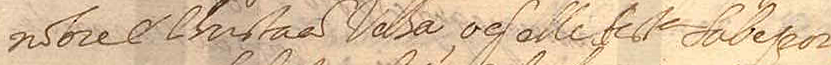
nobre E Christaā Velha, o q̄ elle testa sabe por
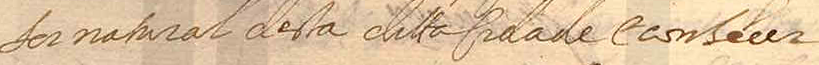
ser natural desta ditta Cidade E conhecer
